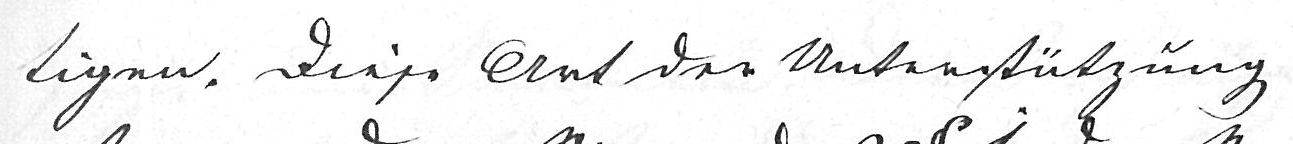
tigen, diese Art der Unterstützung
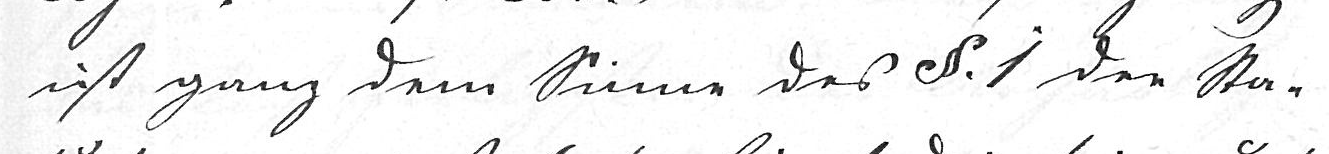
ist ganz dem Sinne des §. 1 der Sta-
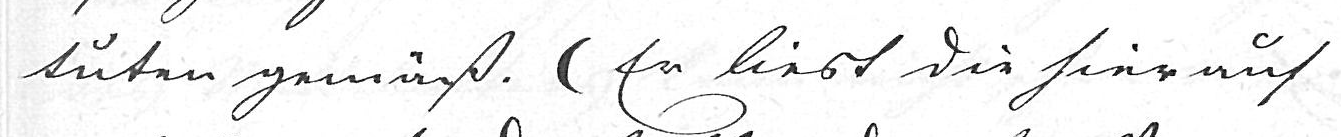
tuten gemäß. (Er liest die hier auf
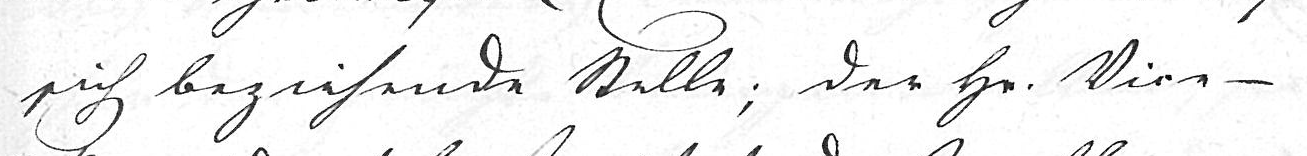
sich beziehende Stelle; der Hr. Vice-
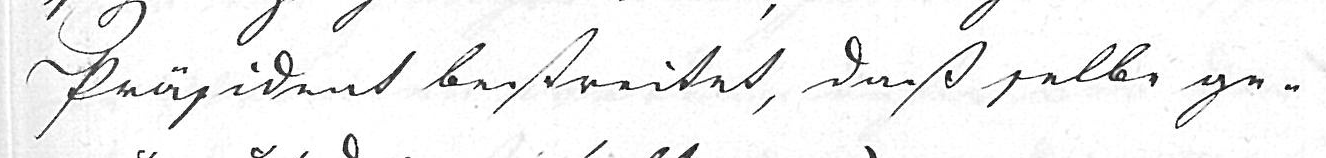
Präsident bestreitet, daß selbe ge-
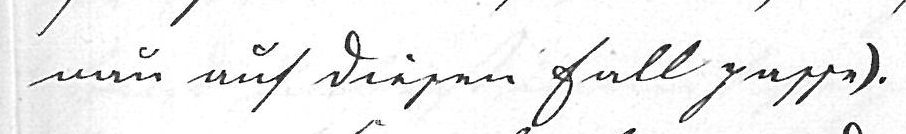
mau auf diesen Fall passe).
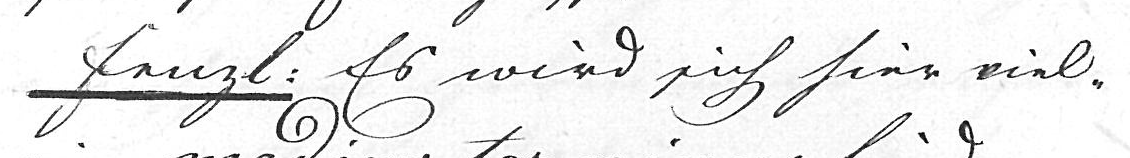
Fenzl: Es wird sich hier viel-
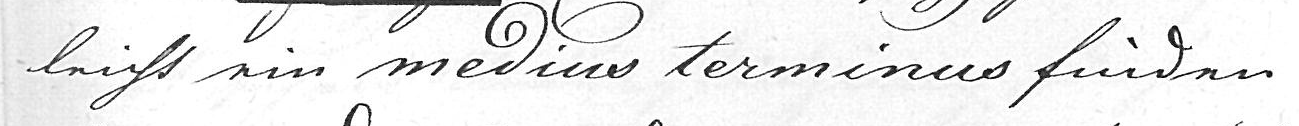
leicht ein medius terminus finden
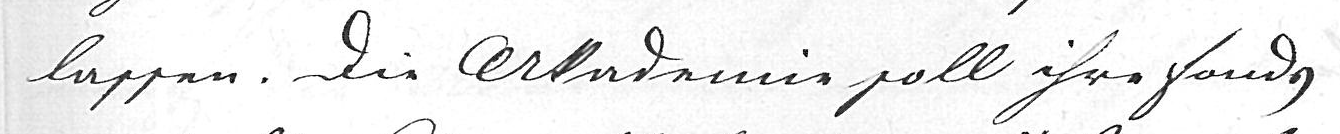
lassen. Die Akademie soll ihre Fonde
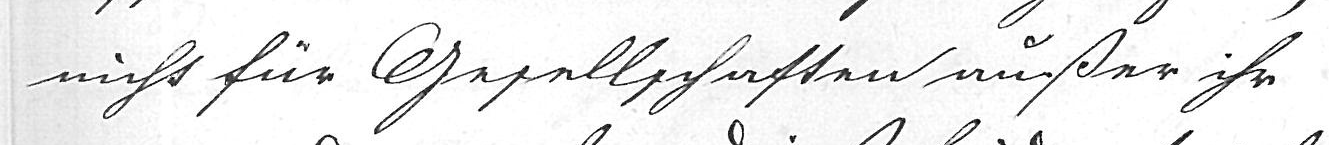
nicht für Gesellschaften außer ihr
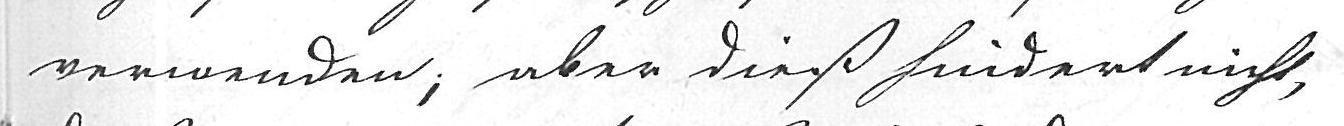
verwenden, aber dieß hindert nicht,
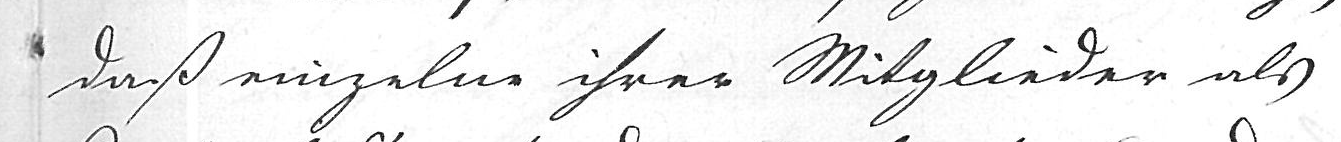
daß einzelne ihrer Mitglieder als
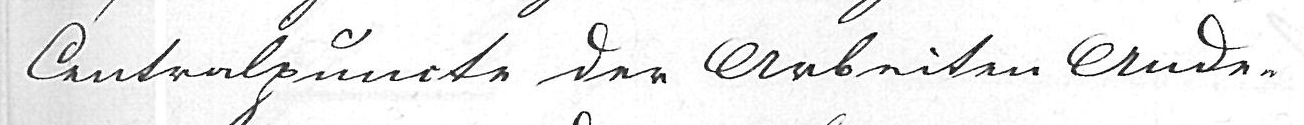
Centralpuncte der Arbeiten Ande-
